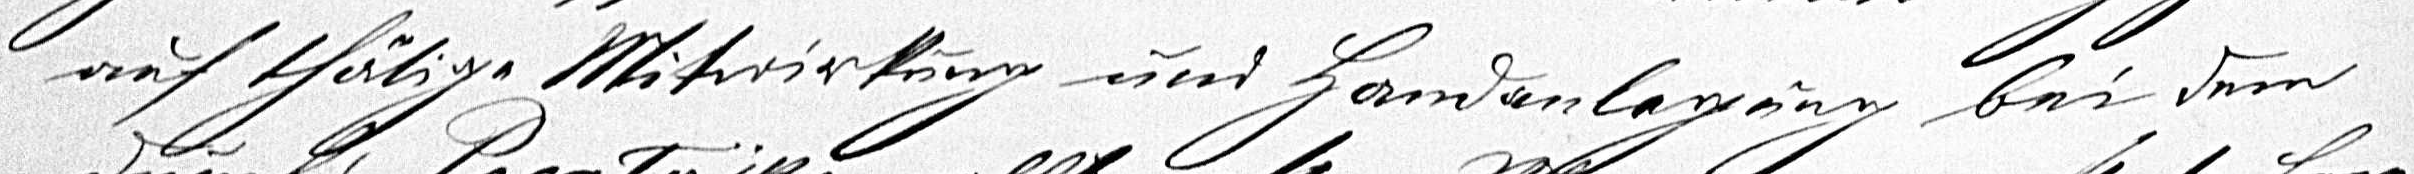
auf thätige Mitwirkung und Handanlegung bei dem
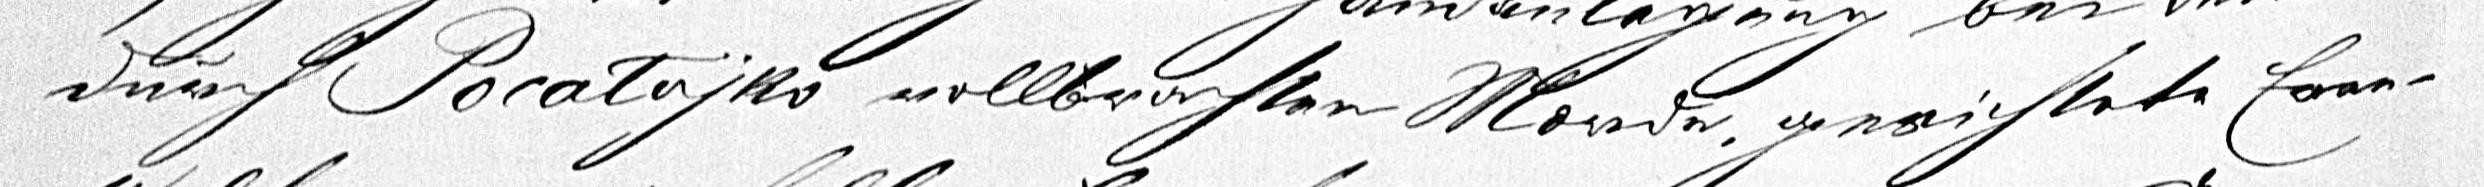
durch Pocatujko vollbrachten Morde, gerichtete Even¬
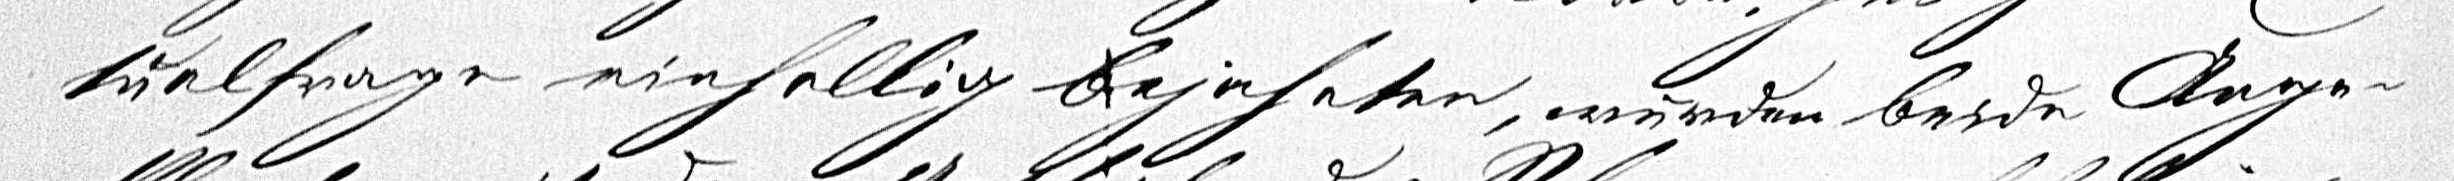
tualfrage einhellig bejahrten, wurden beide Ange¬
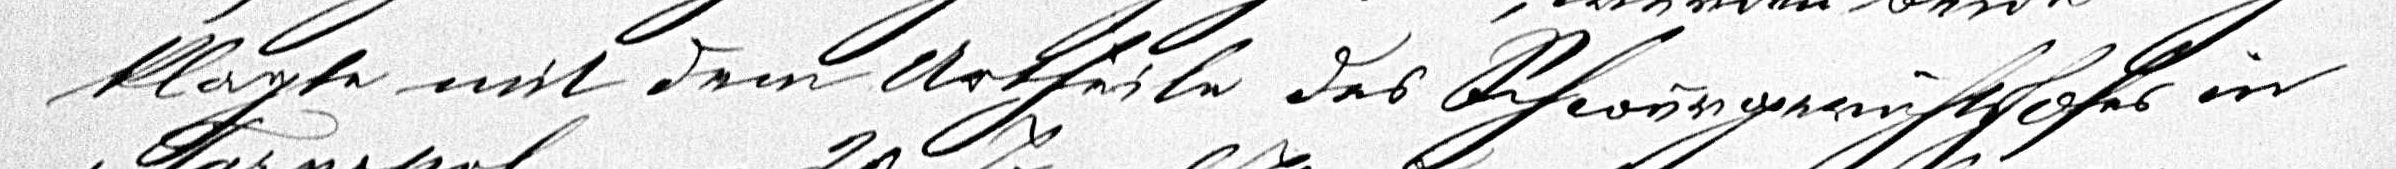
klagte mit dem Urtheile des Schwurgerichtshofes in
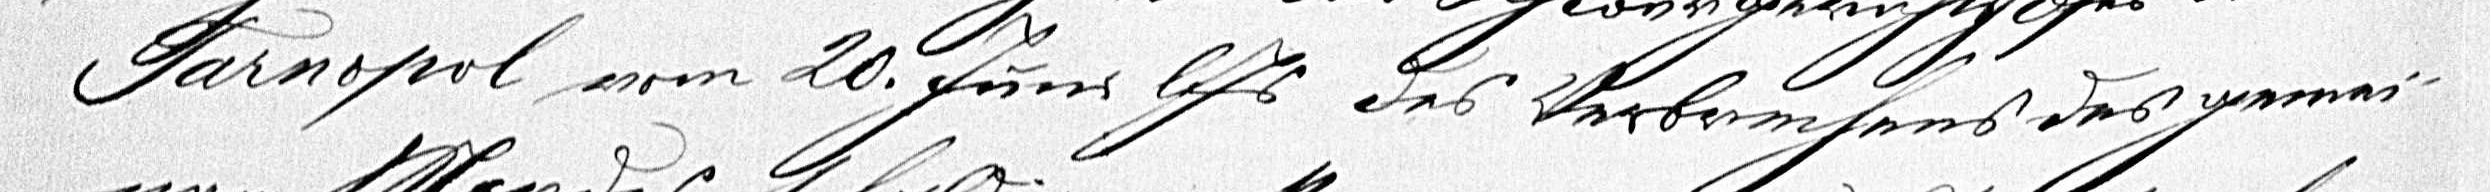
Tarnopol vom 20. Juni lJs des Verbrechens des gemei¬
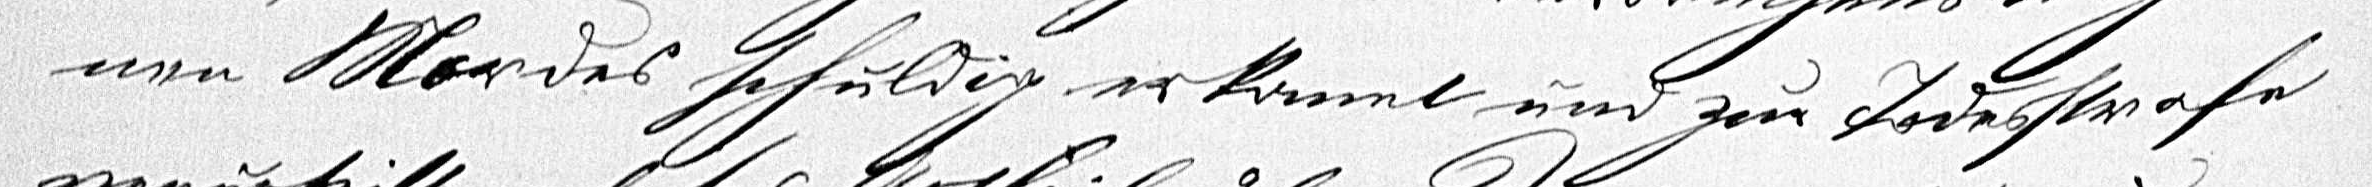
nen Mordes schuldig erkannt und zur Todesstrafe
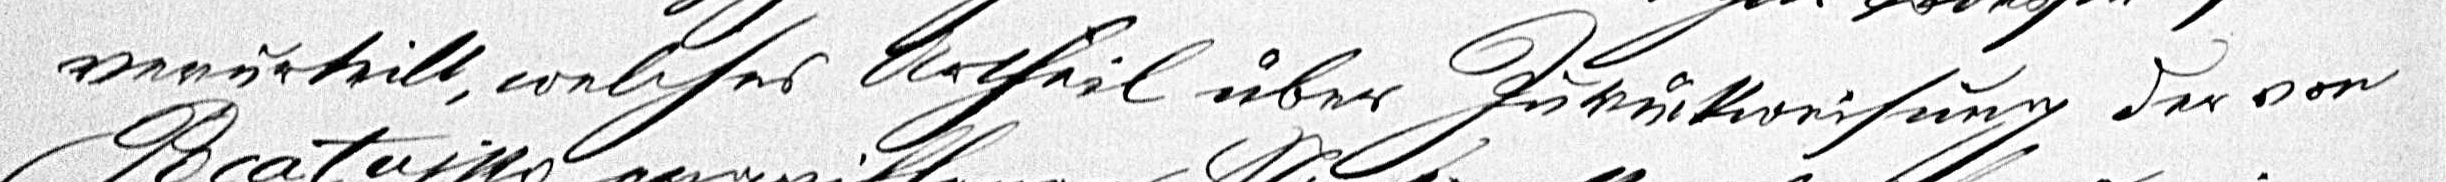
verurteilt, welches Urtheil über Zurückweisung der von
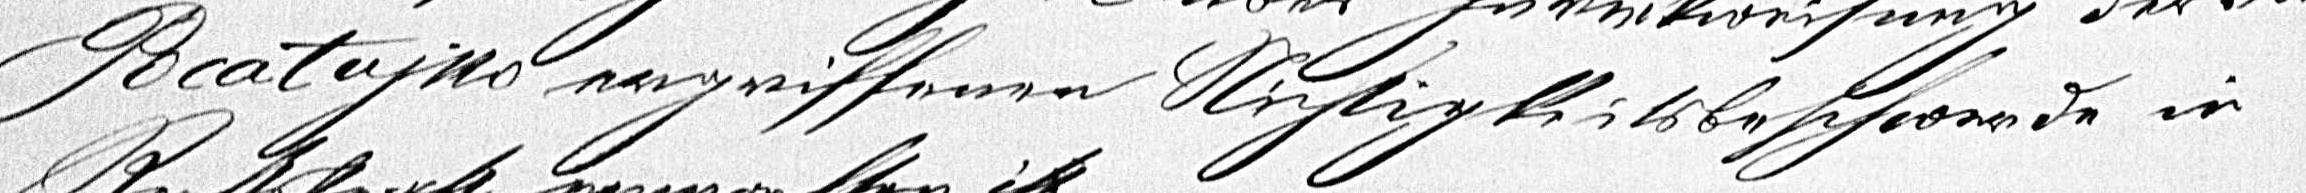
Pocatujko ergriffenen Nichtigkeitsbeschwerde in
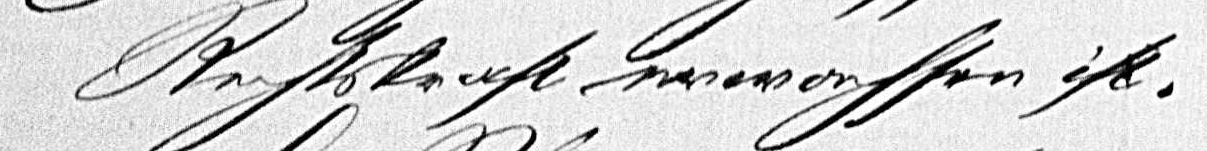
Rechtskraft erwachsen ist.
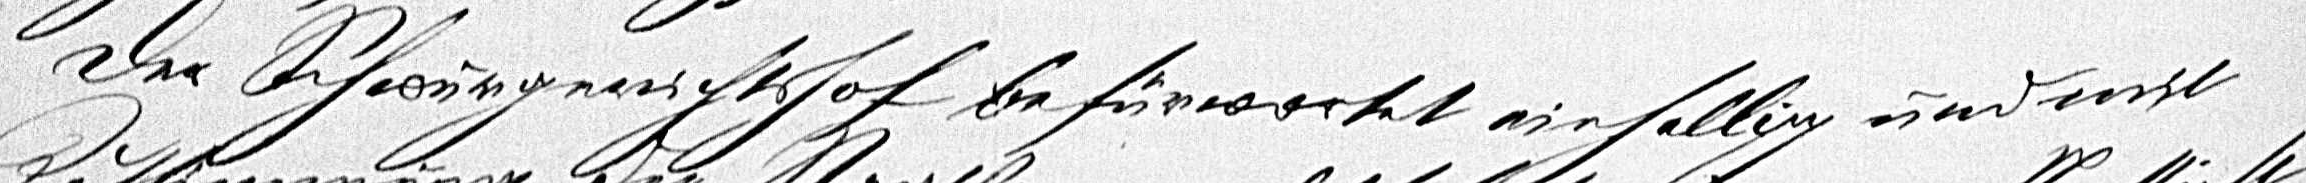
Der Schwurgerichtshof befürwortet einhellig und mit
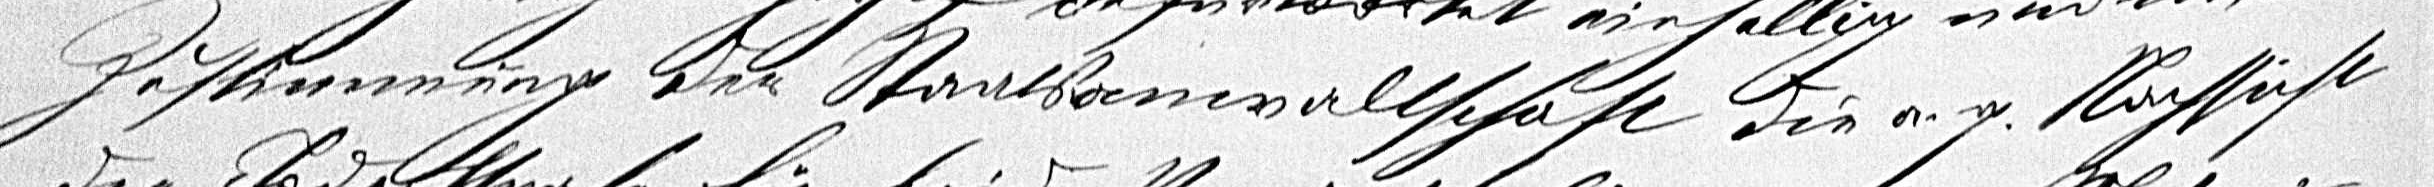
Zustimmung der Staatsanwaltschaft die a. g. Nachsicht
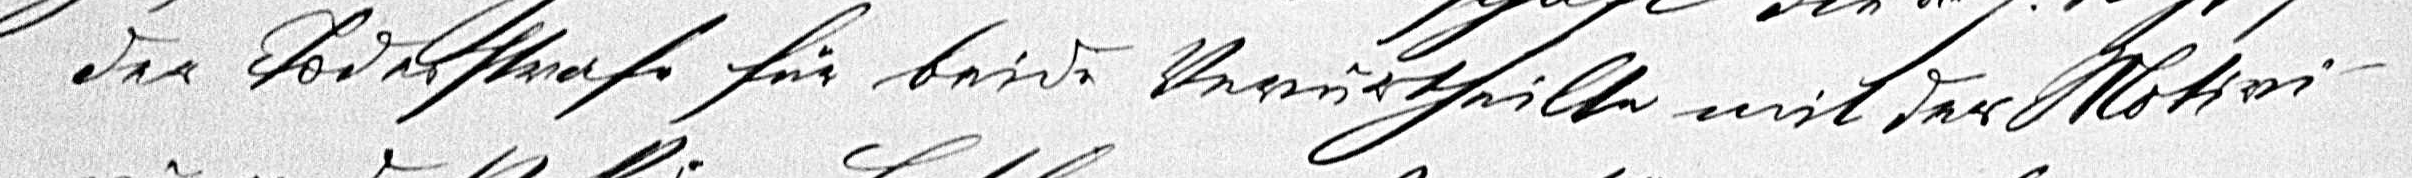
der Todesstrafe für beide Verurtheilte mit der Motivi¬
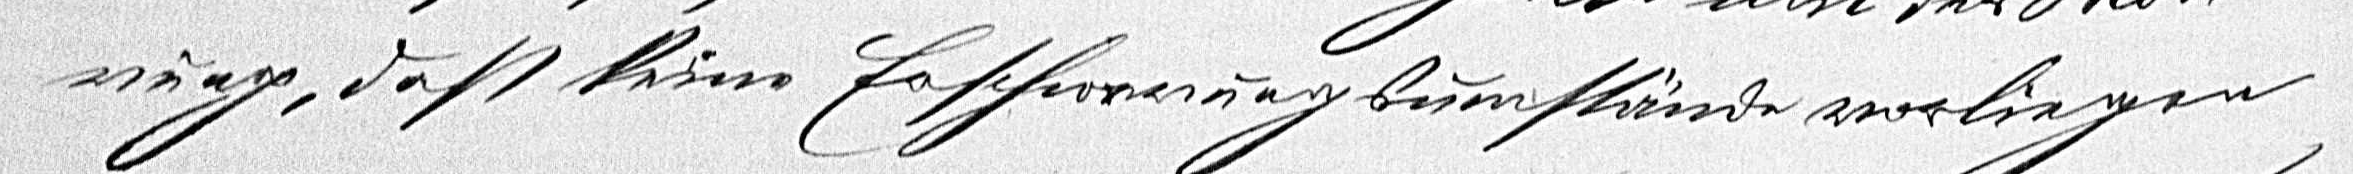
rung, daß keine Erschwerungsumstände vorliegen
